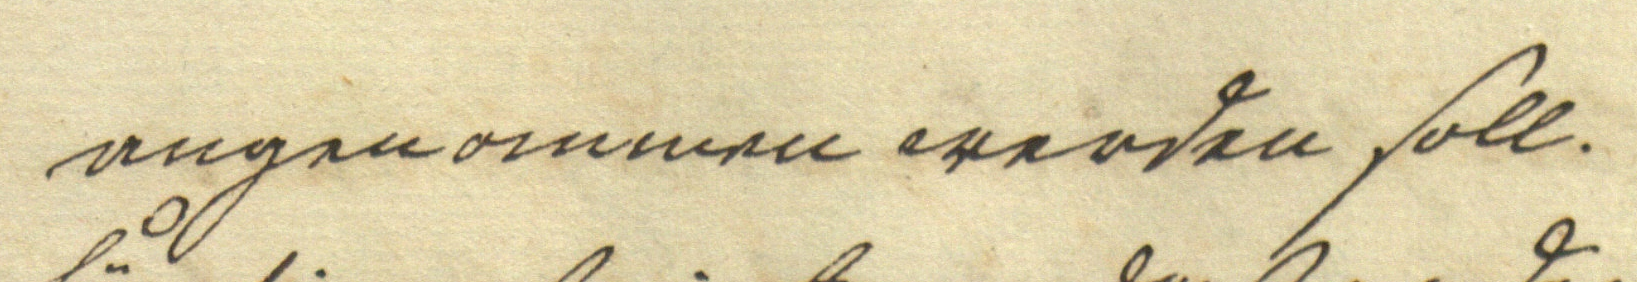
angenommen werden soll.
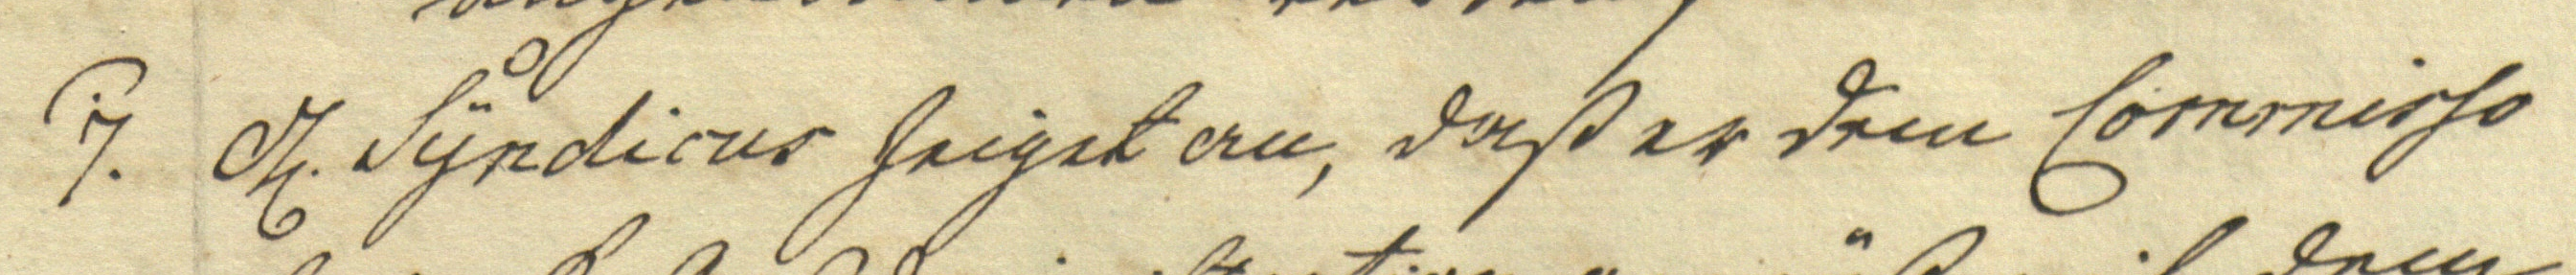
7. dh. Sÿndicus zeiget an, daß er dem Commisso
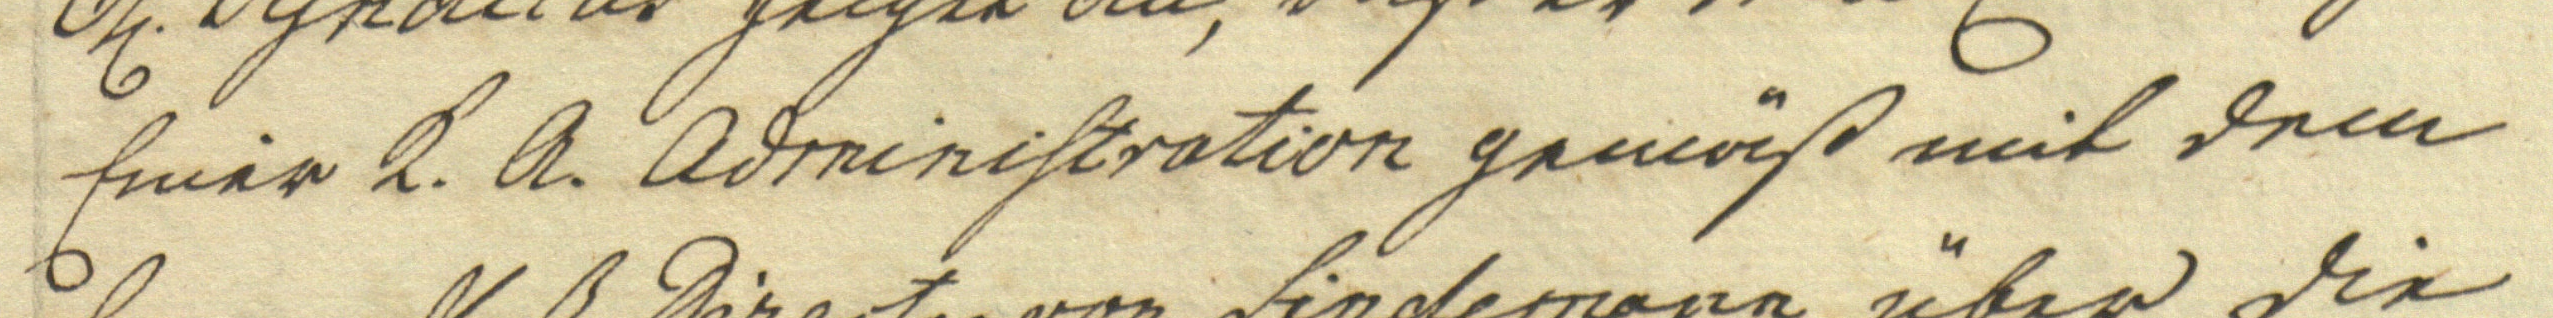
einer K. A. Administration gemäß mit dem
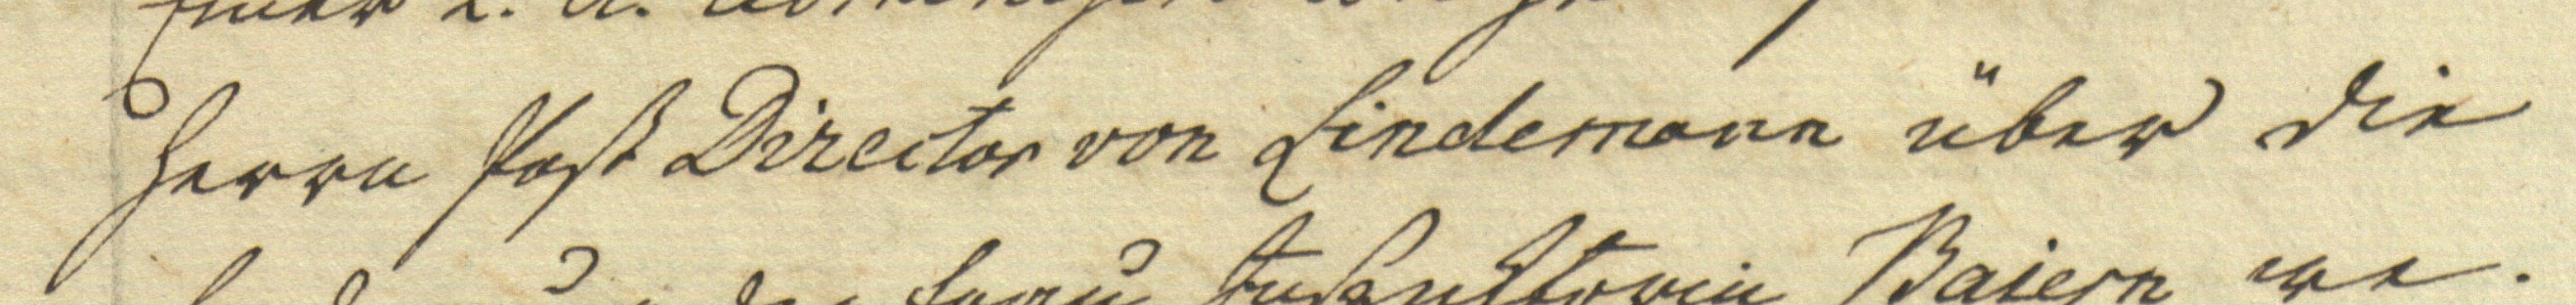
Herrn Post Director von Lindemann über die
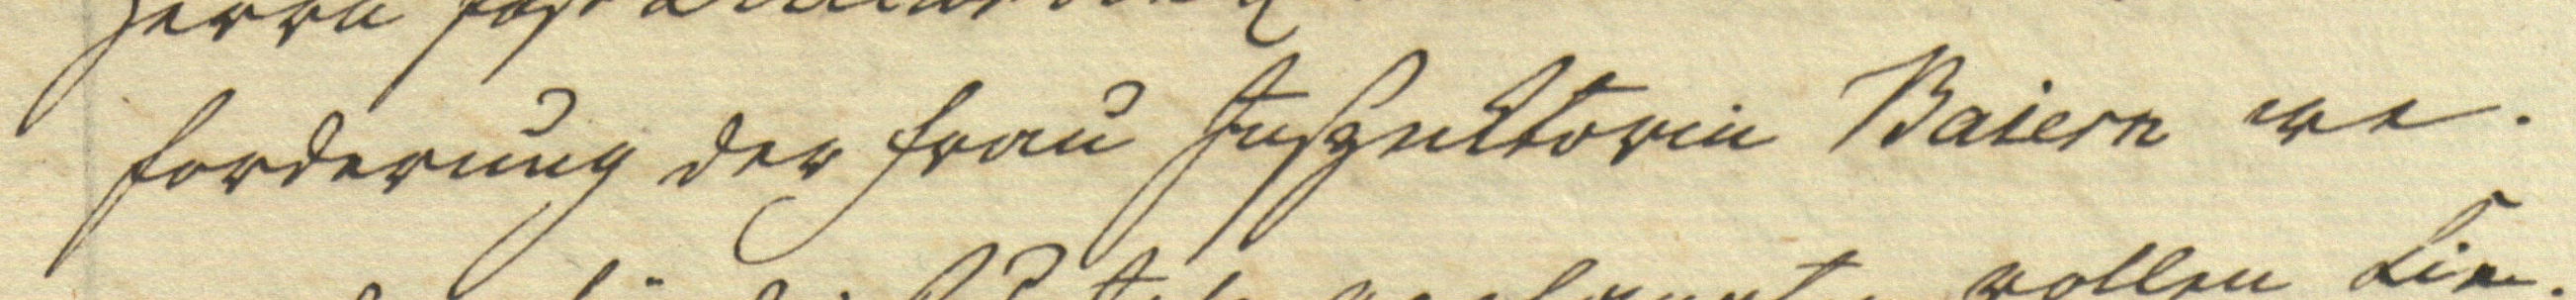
Forderung der Frau Inspektorin Baiern we¬
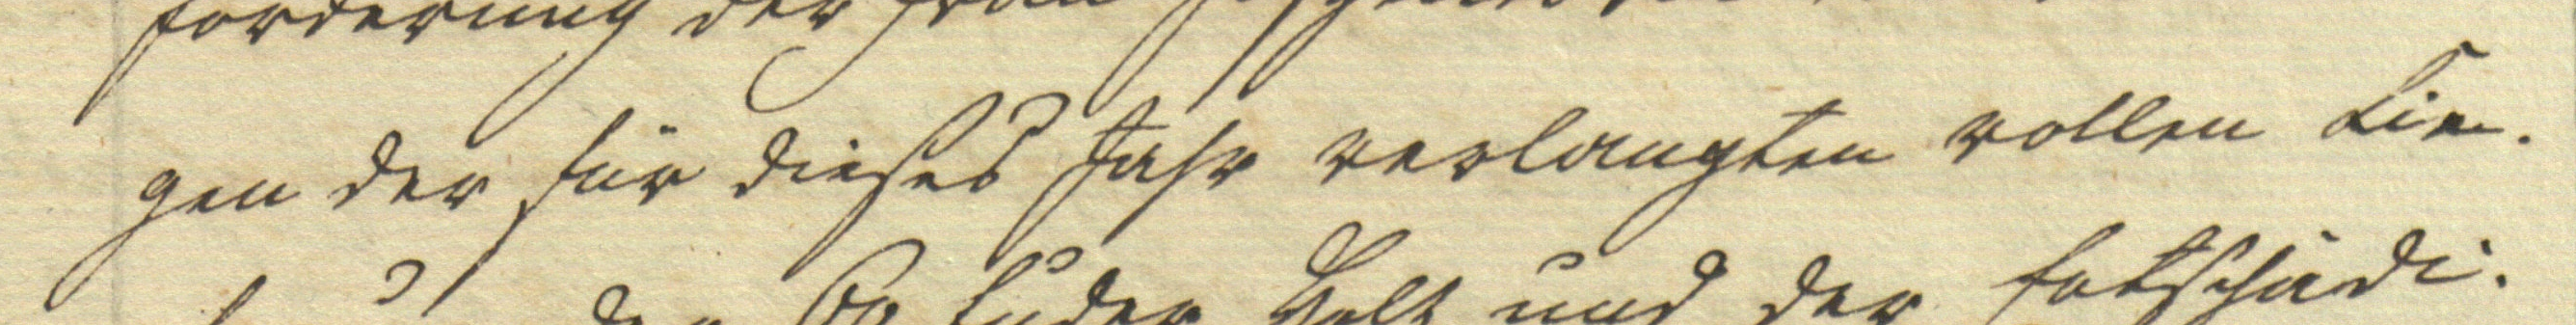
gen der für dieses Jahr verlangten vollen Lie¬
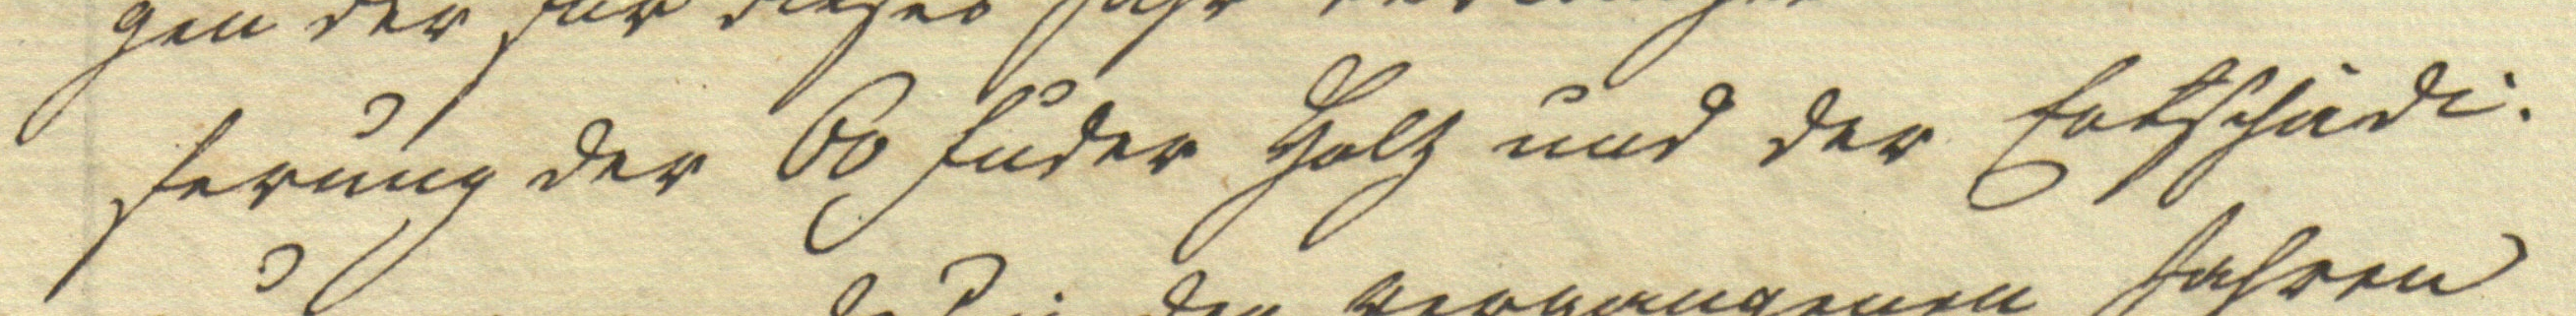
ferung der 60 Fuder Holz und der Entschädi¬
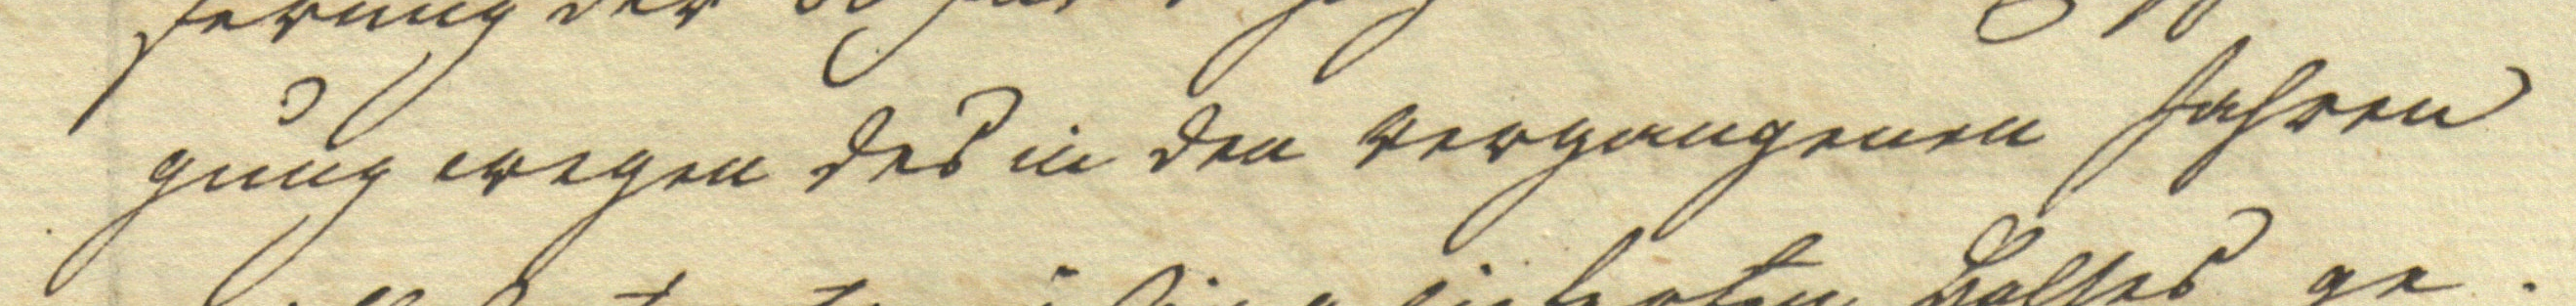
gung wegen des in den vergangenen Jahren
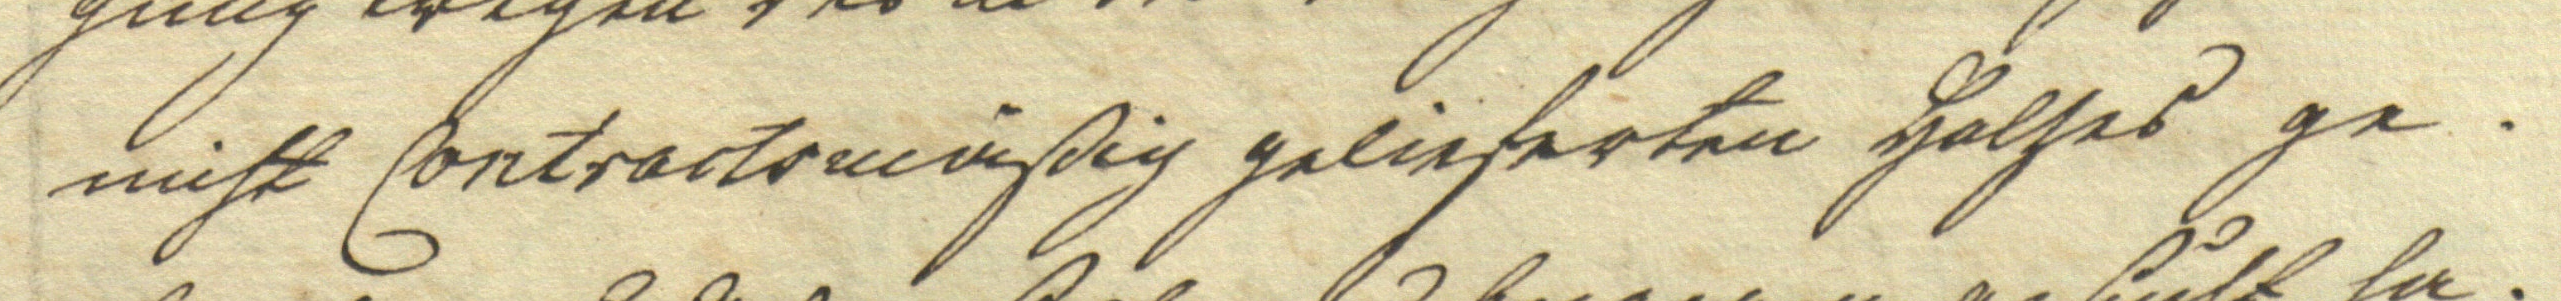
nicht Contractsmäßig gelieferten Holzes ge¬
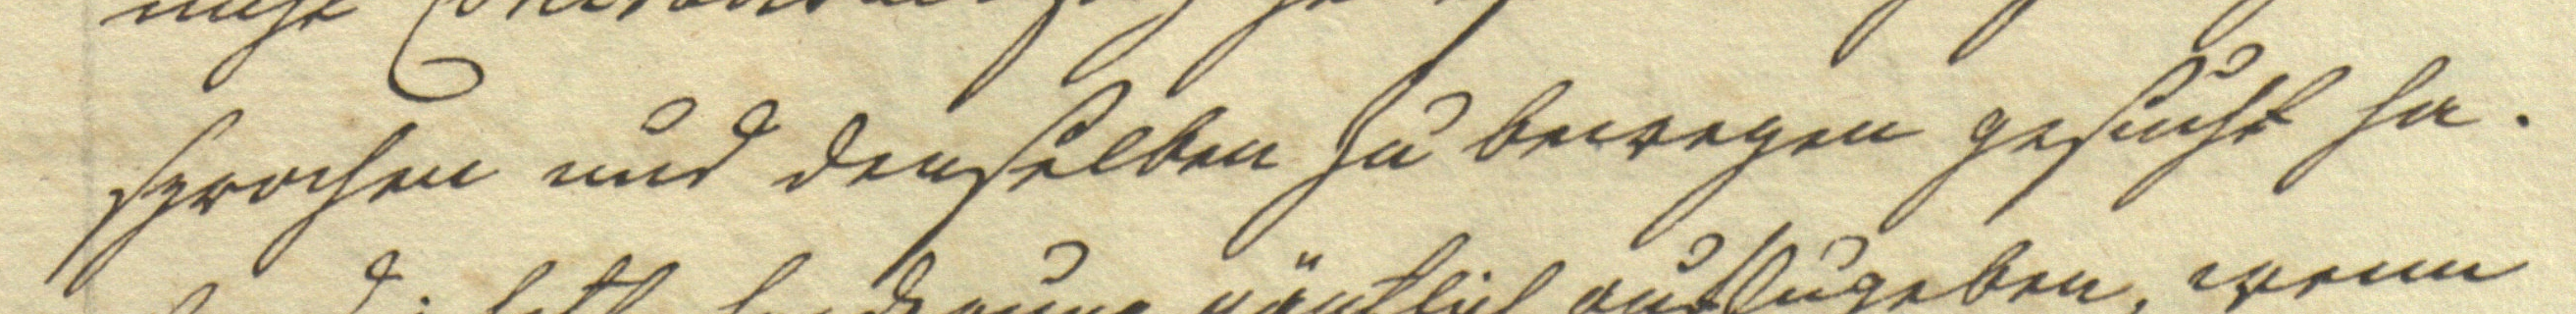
sprochen und denselben zu bewegen gesucht ha¬
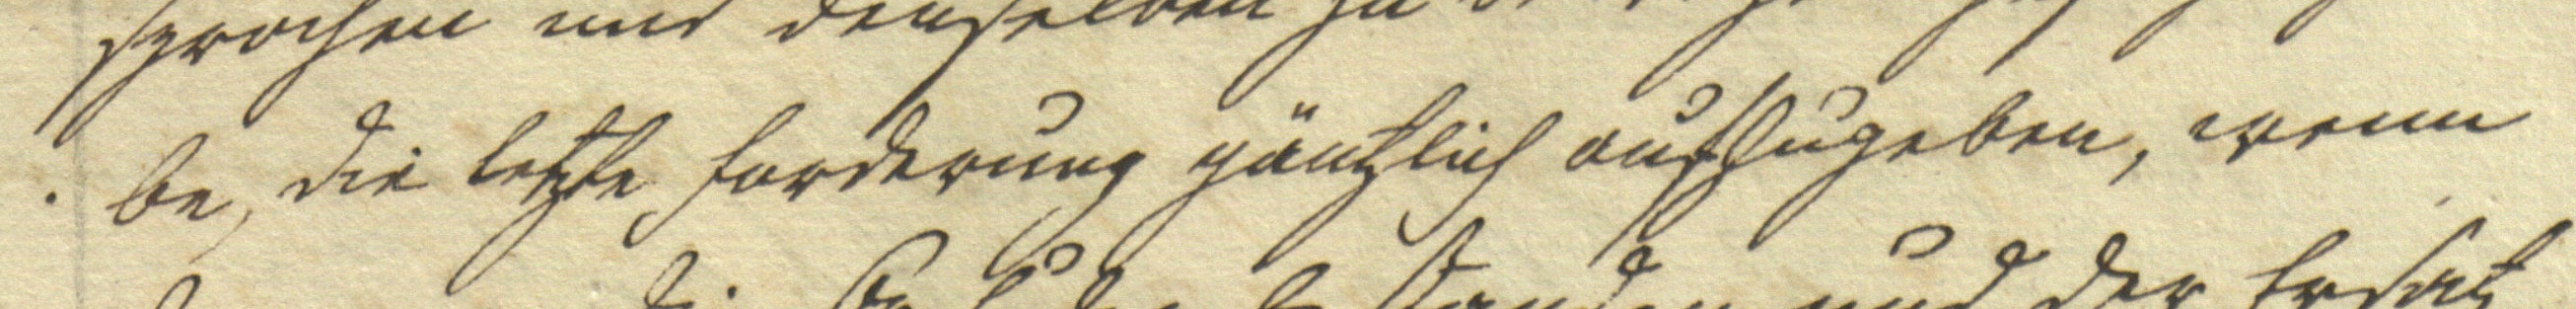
be, die letzte Forderung gäntzlich aufzugeben, wenn
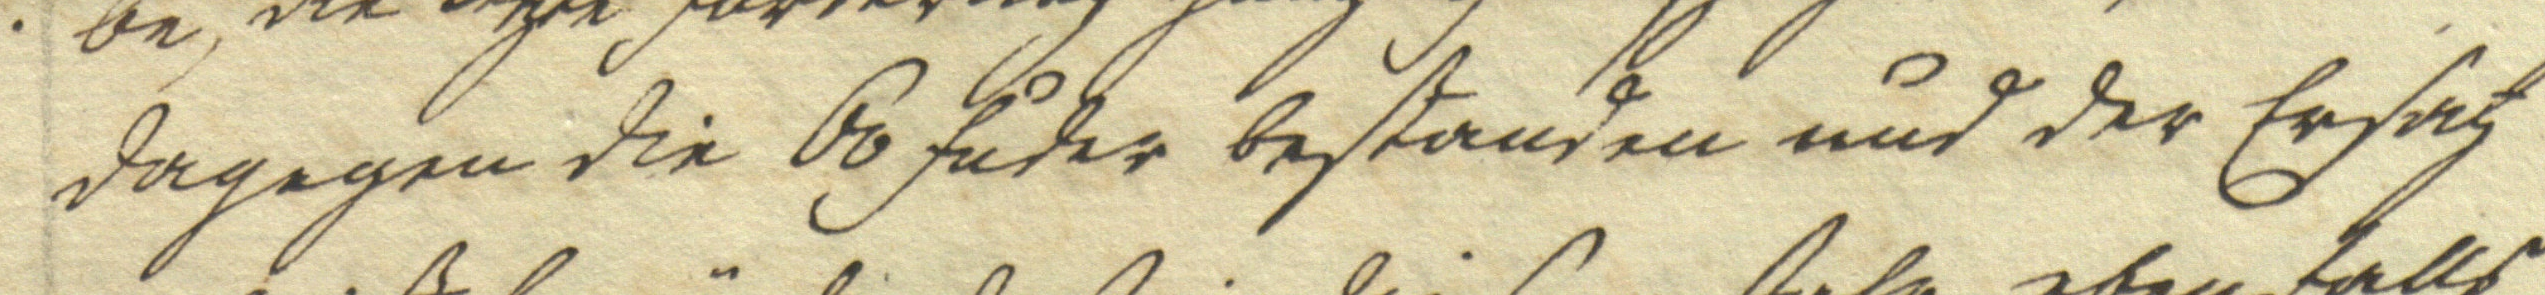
dagegen die 60 Fuder bestanden und der Ersatz
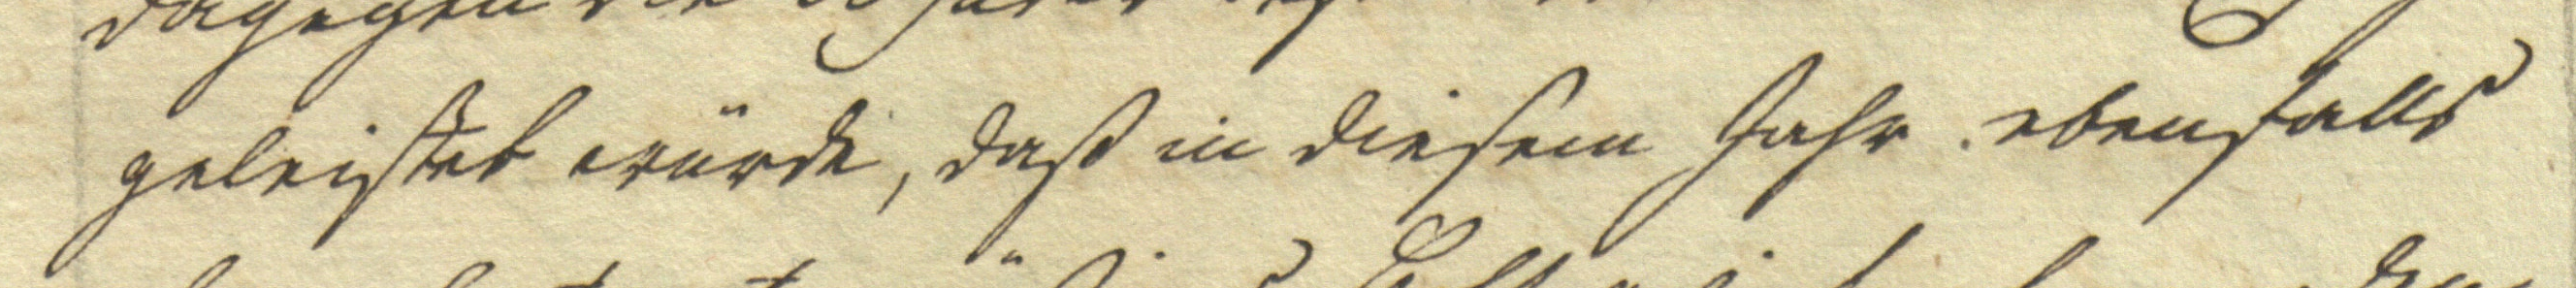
geleistet würde, daß in diesem Jahr ebenfalls
